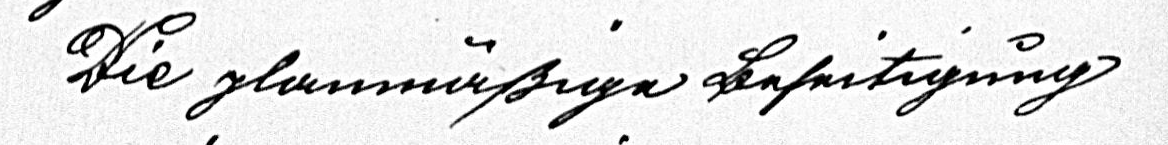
Die planmäßige Beseitigung
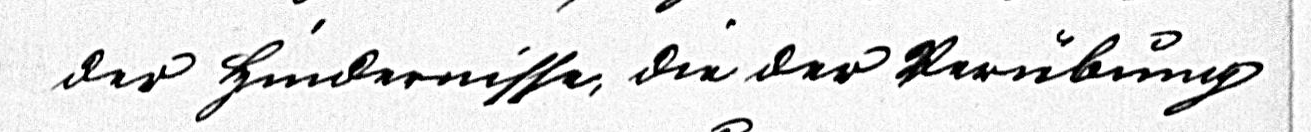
der Hindernisse, die der Verübung
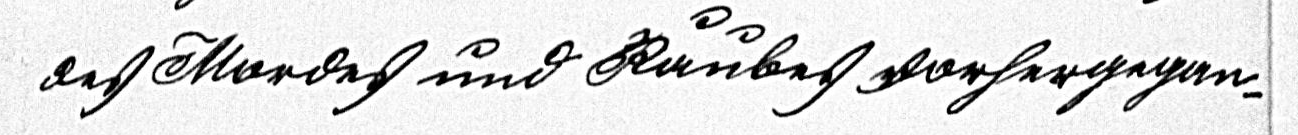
des Mordes und Raubes vorhergegan¬
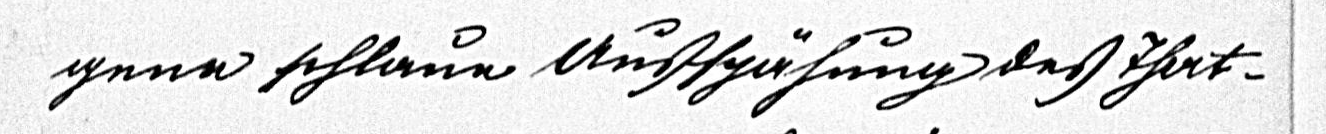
gene schlaue Ausspähung des That¬
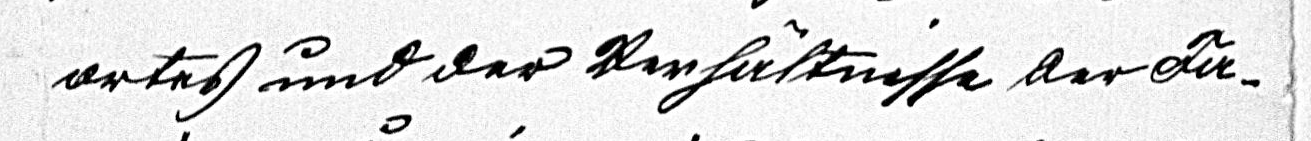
ortes und der Verhältnisse der Fa¬
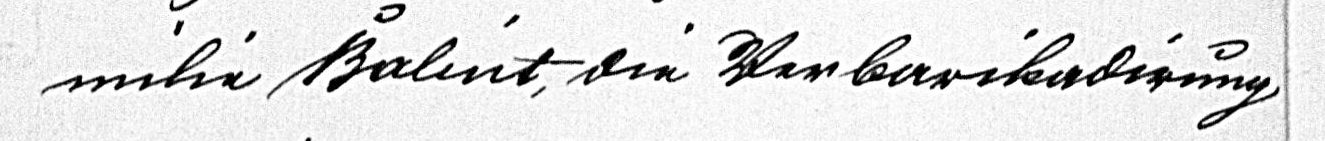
milie Balint, die Verbarikadirung
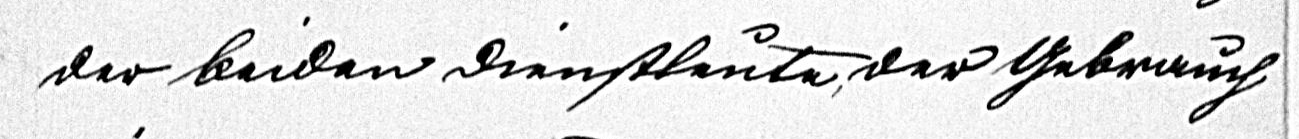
der beiden Dienstleute, der Gebrauch
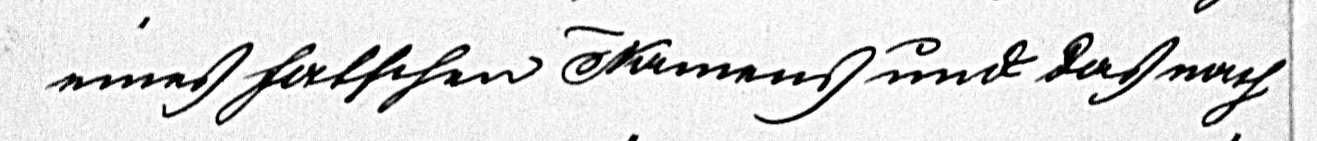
eines hatschen Namens und das nach
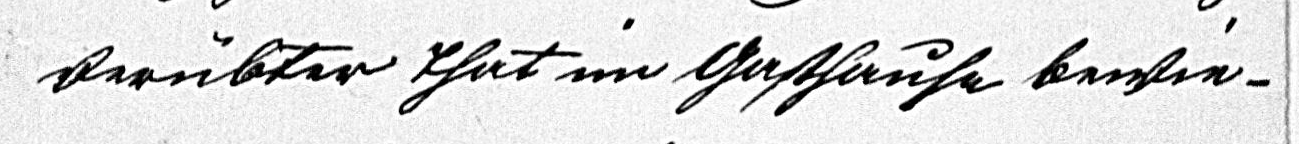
verübter That im Gasthause bewie¬
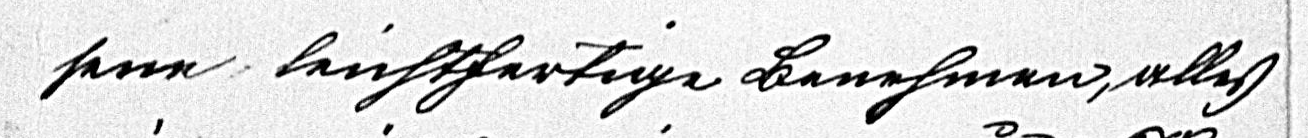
sene leichtfertige Benehmen, alles
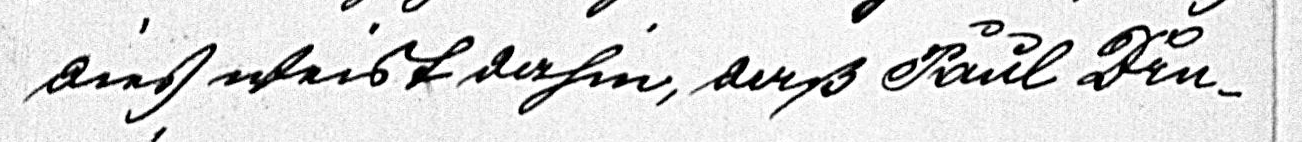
dies weist dahin, daß Paul Dru¬
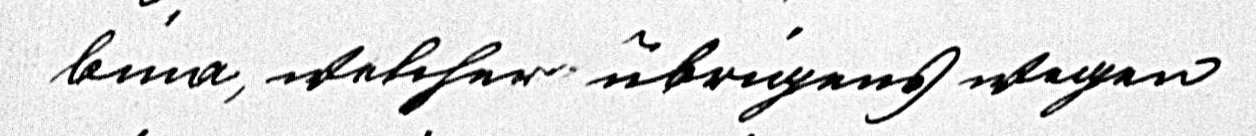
bina, welcher übrigens wegen
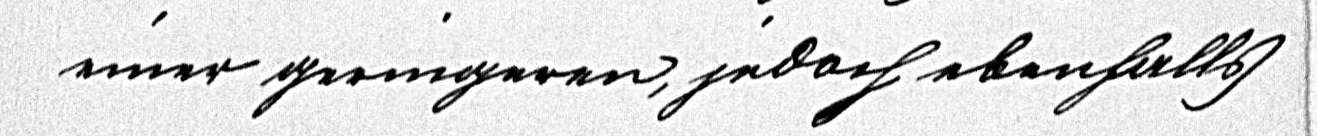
einer geringeren, jedoch ebenhalls
